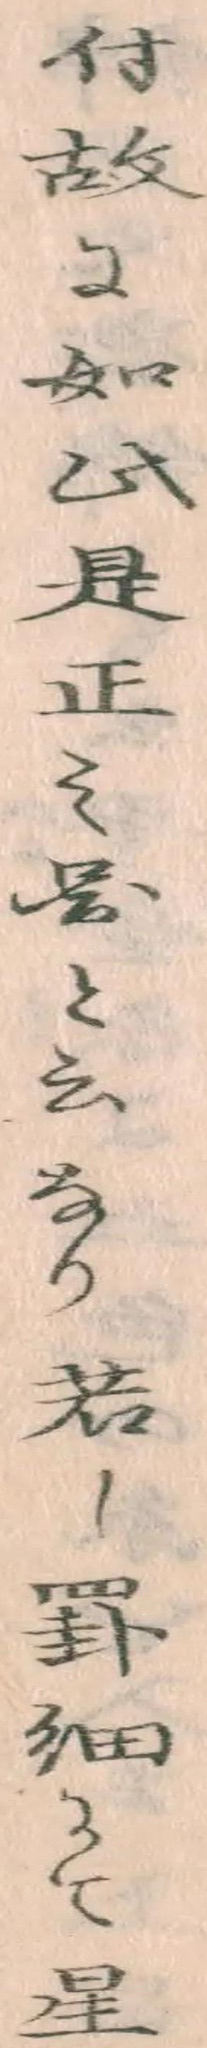付故に如此是正の図と云なり若し罫細にて星
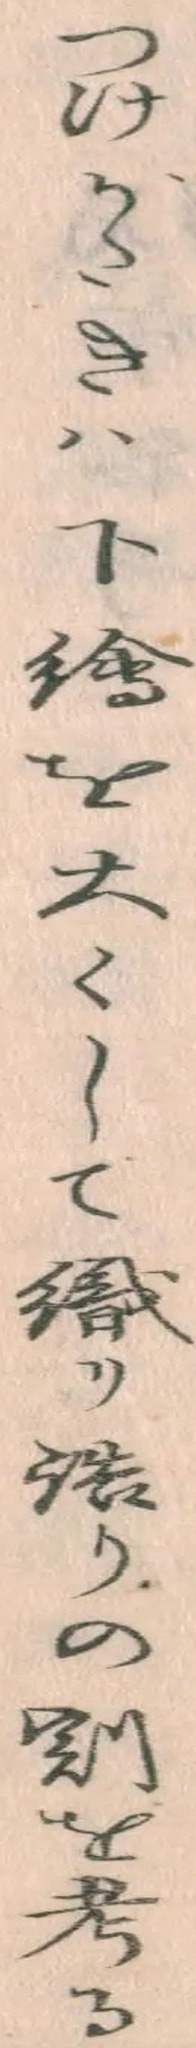つけかたきは下絵を大くして織り詰りの割を考る
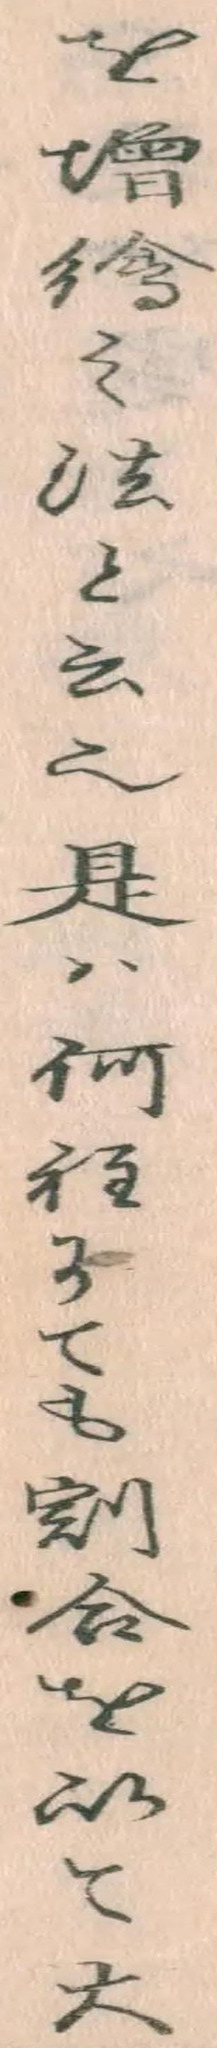を増絵之法と云也是は何程にても割合を以て大
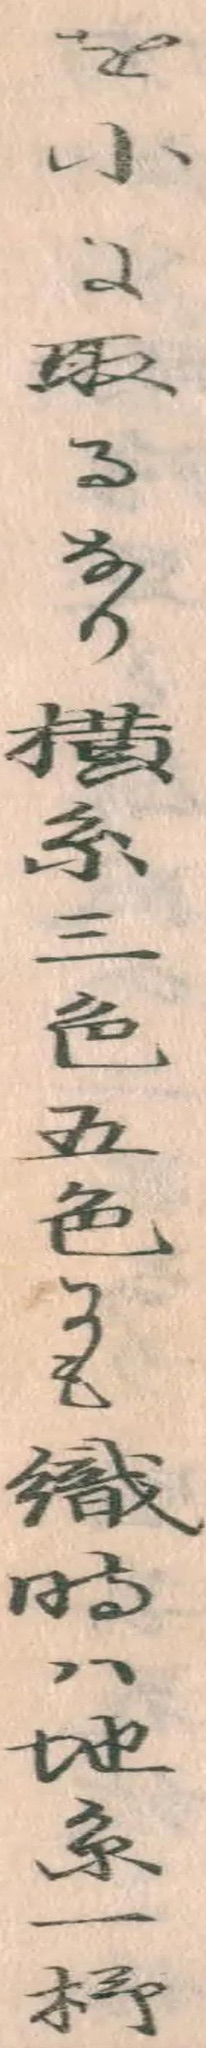を小に取るなり横糸三色五色にも織時は地糸一杼
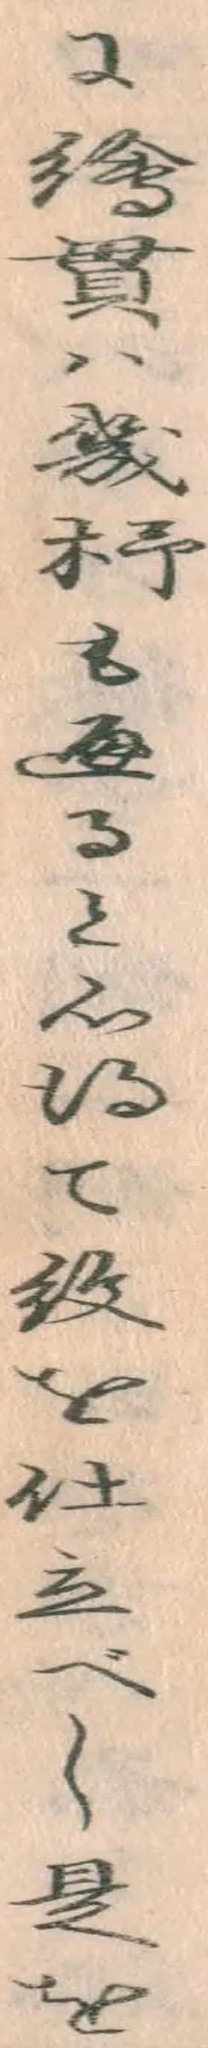に絵貫は幾杼も通ると心得て紋を仕立べし是を
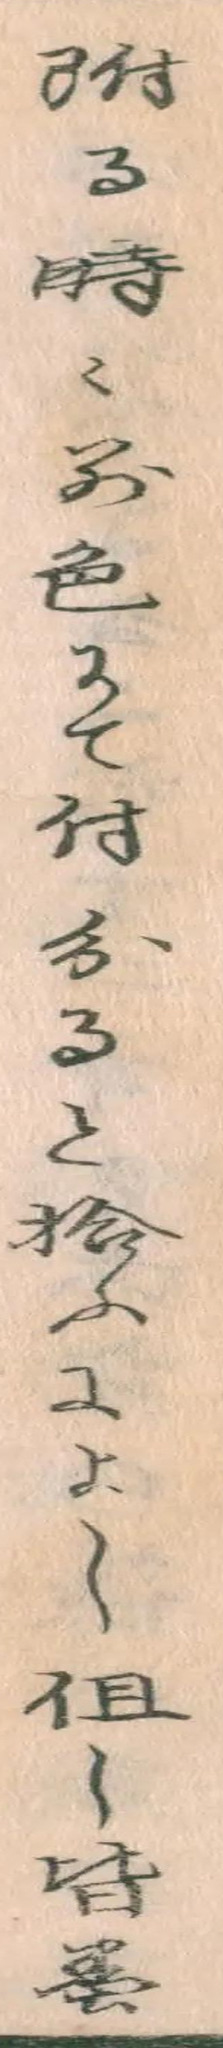附る時々別色にて付分ると拾ふによし但し皆墨
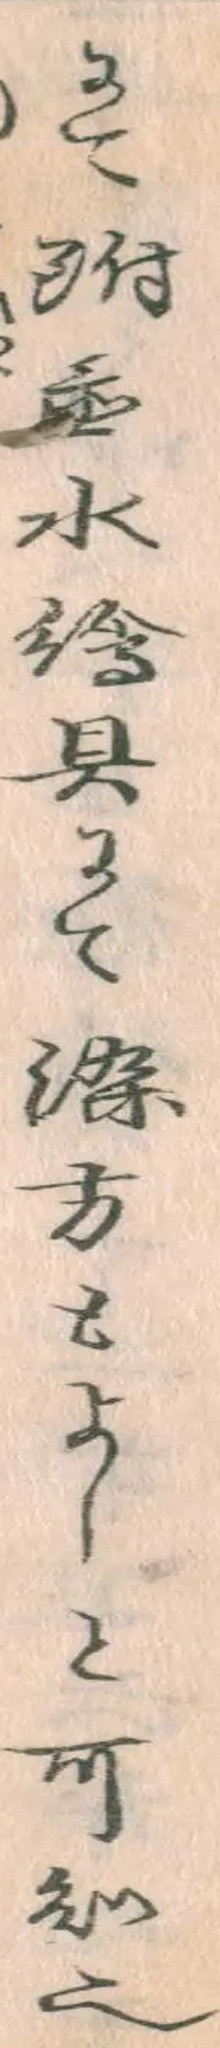にて附置水絵具にて染方もよしと可知也
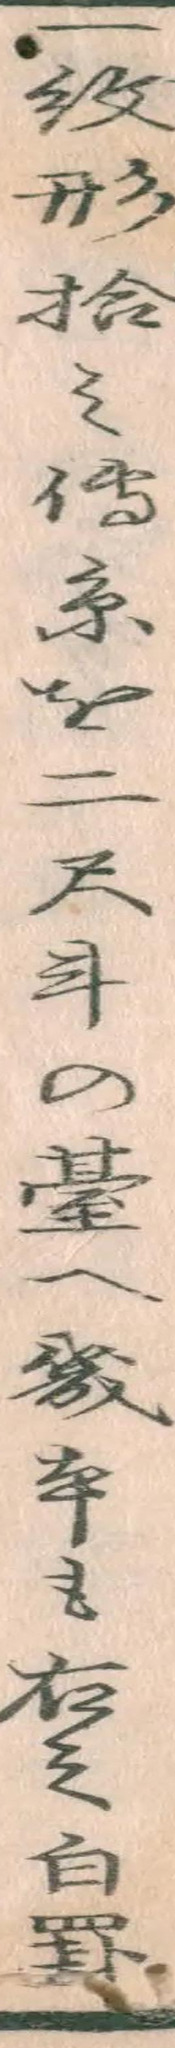一紋形拾之伝糸を二尺斗の台へ幾本も右之白罫
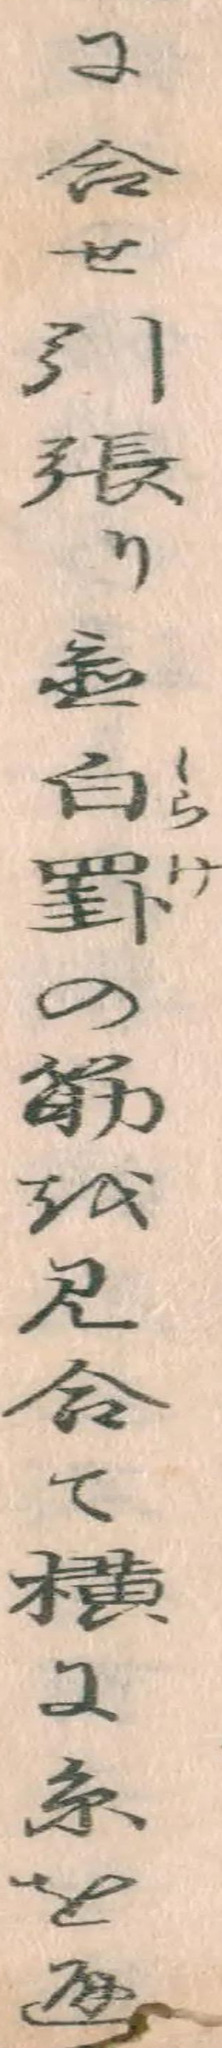に合せ引張り置白罫の筋を見合て横に糸を通
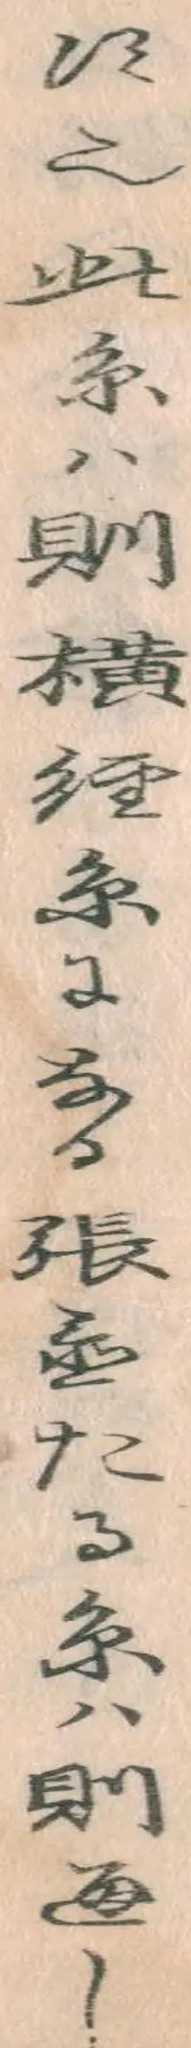す也此糸は則横経糸になる張置たる糸は則通し
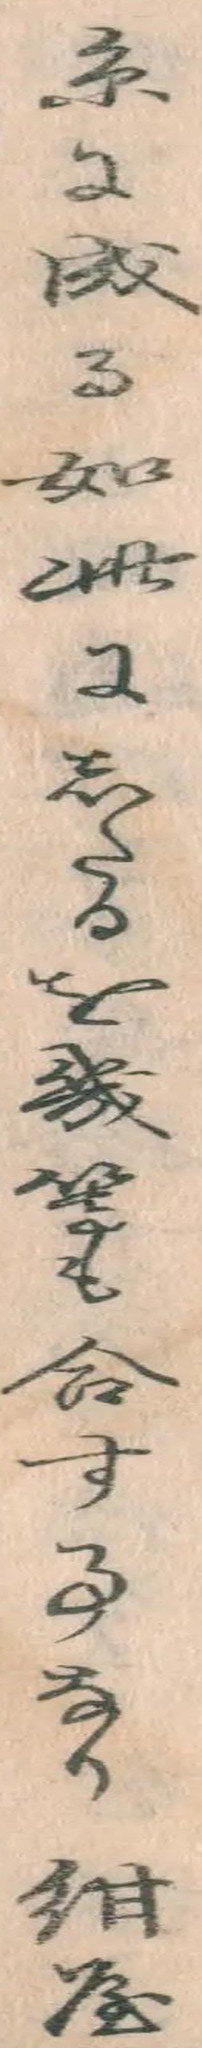糸に成る如此にしたるを幾等も合す事なり紺屋

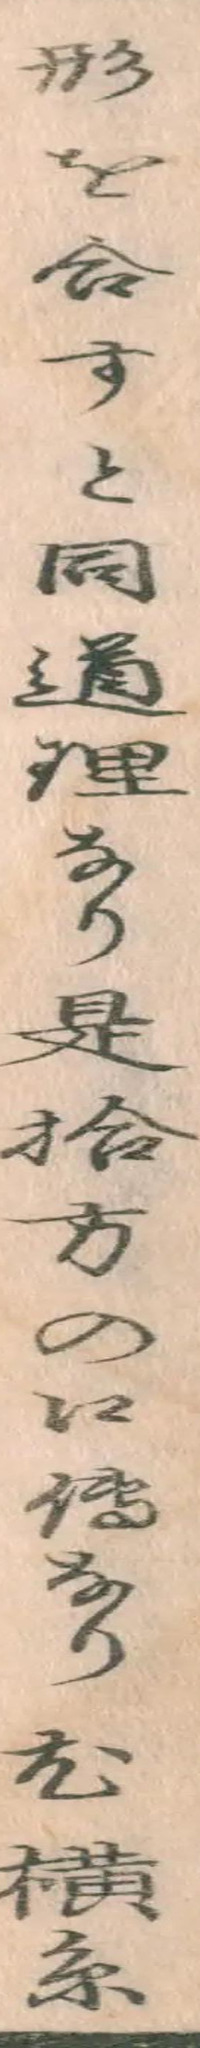形を合すと同道理なり是拾方の口伝なり尤横糸
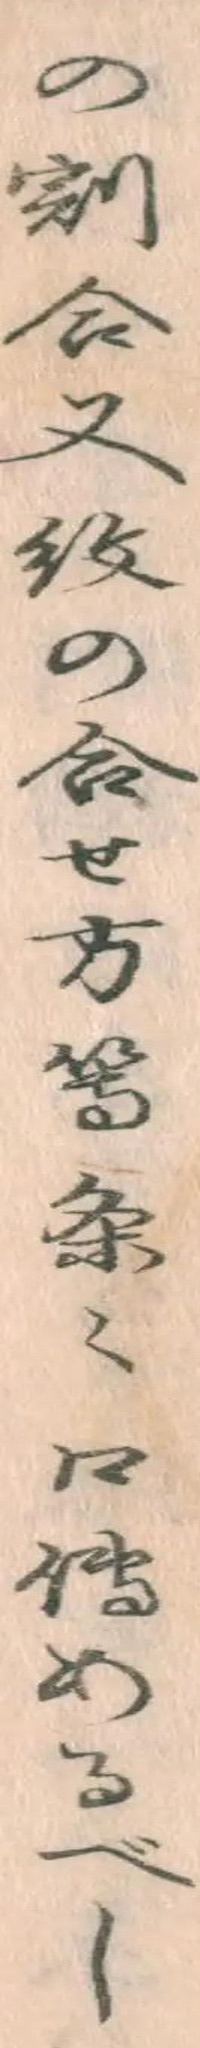の割合又紋の合せ方等条々口伝あるべし
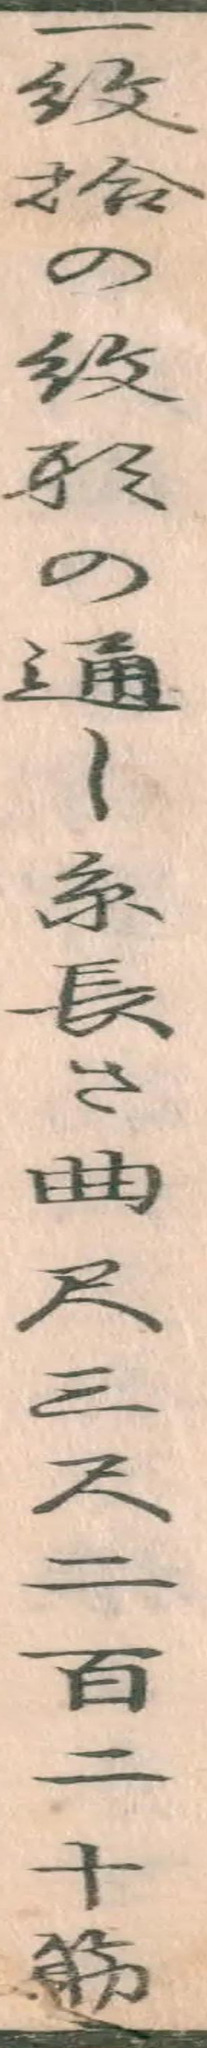一紋拾の紋形の通し糸長さ曲尺三尺二百二十筋
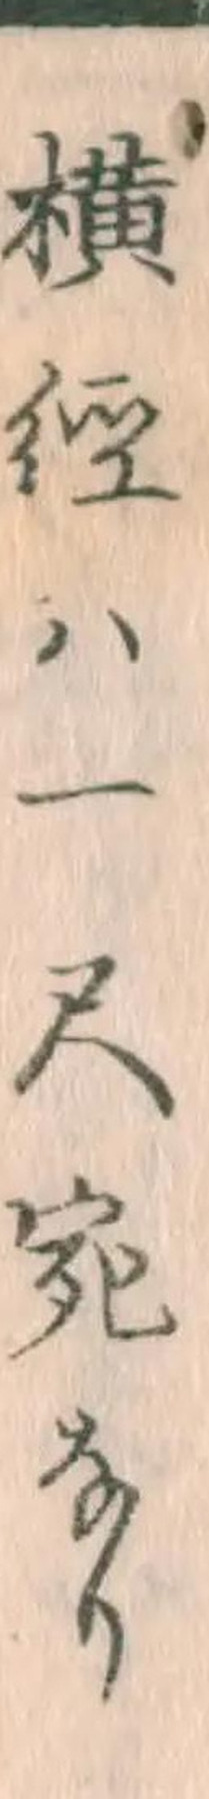横経は一尺宛なり
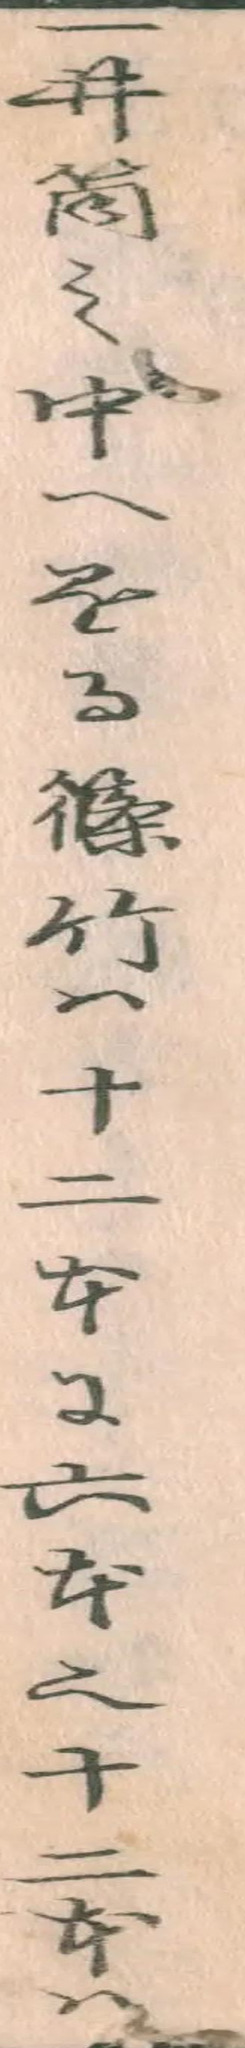一井筒之中へ懸る篠竹は十二本に六本也十二本は
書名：機織彙編 5巻. [2]
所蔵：国立国会図書館 National Diet Library, JAPAN
